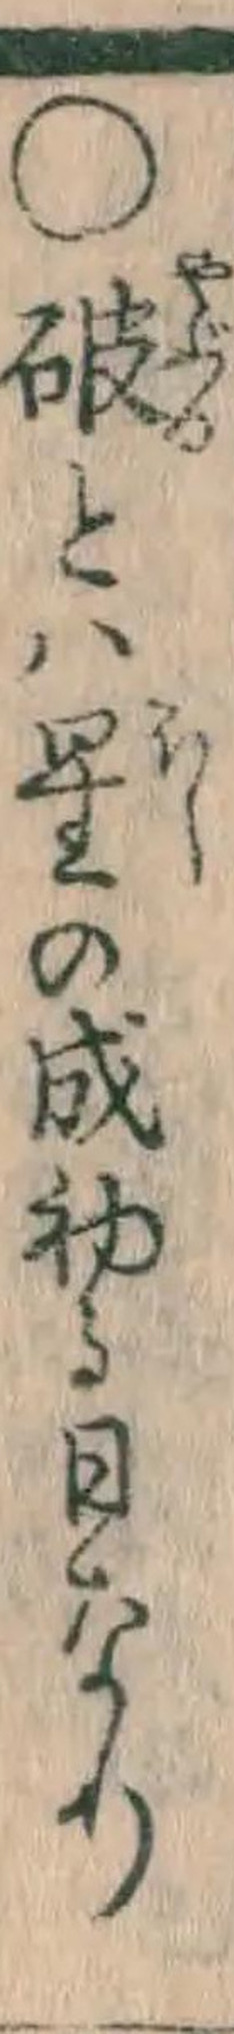○破とは星の成初る日なり
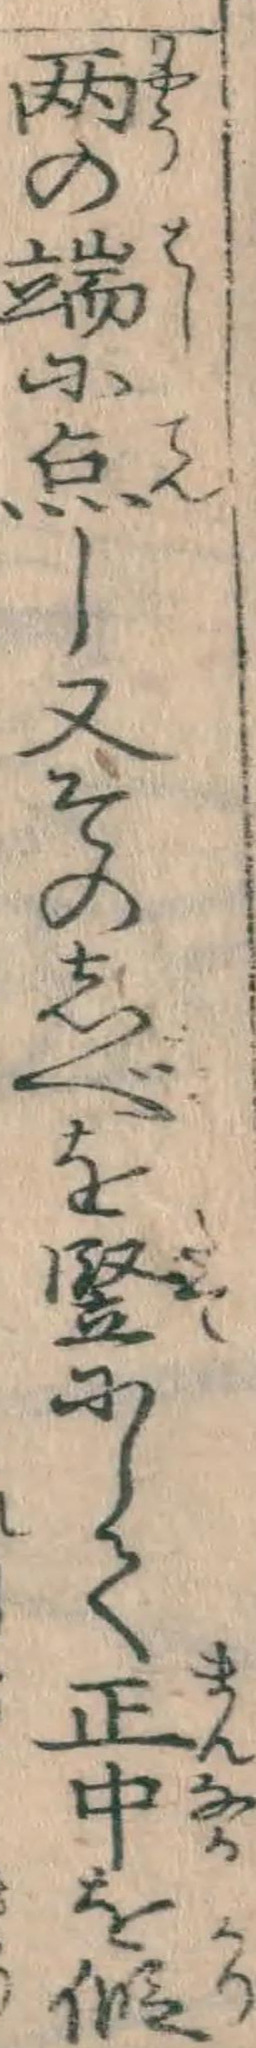両の端に点し又そのしべを竪にして正中を仮
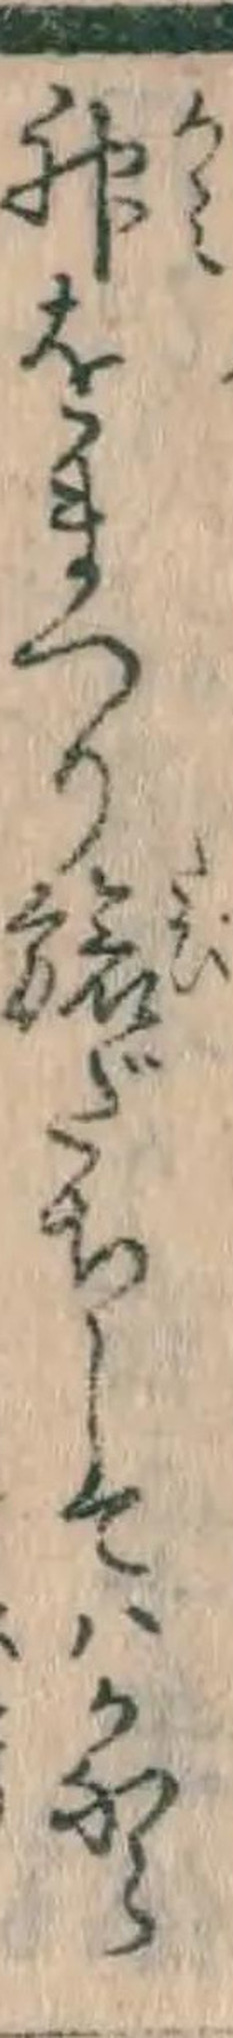神をまつり旅だちしてはかなら
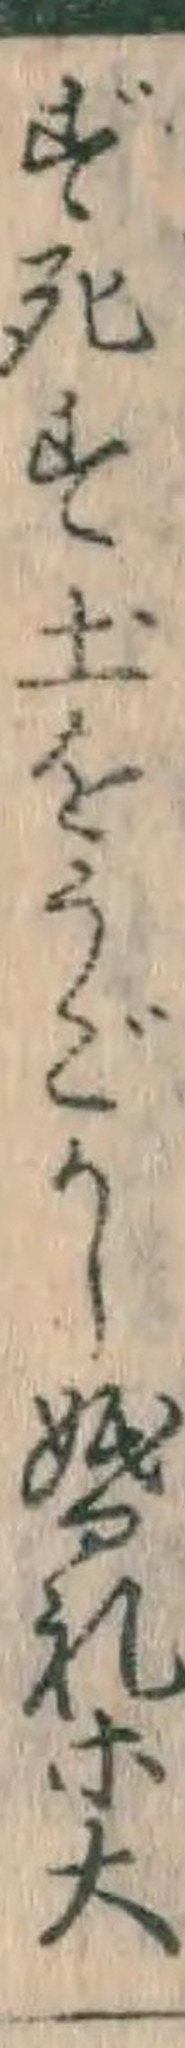ず死す土をうごかし婚礼等大
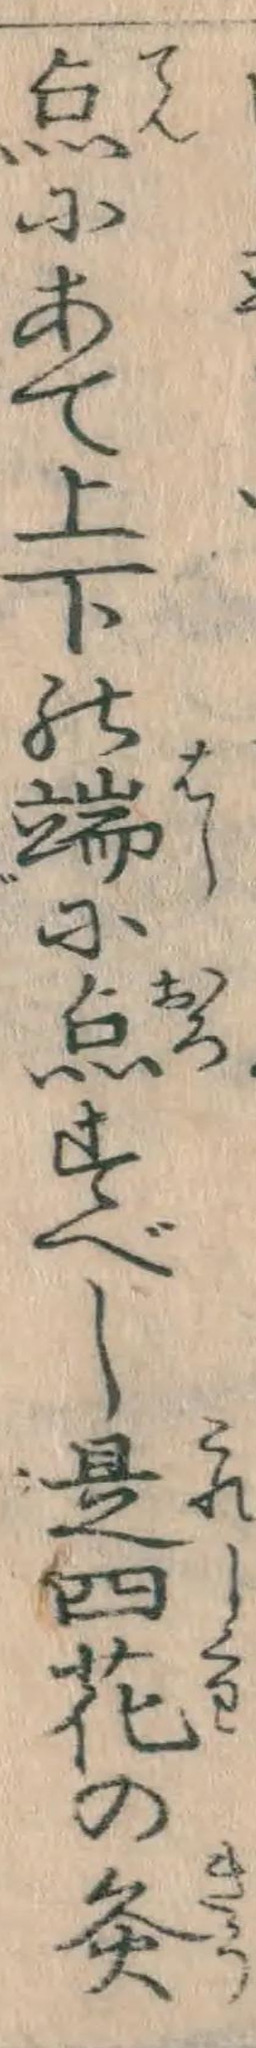点にあて上下の端に点すべし是四花の灸
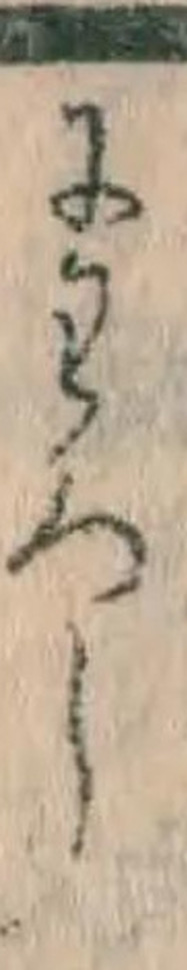にわろし
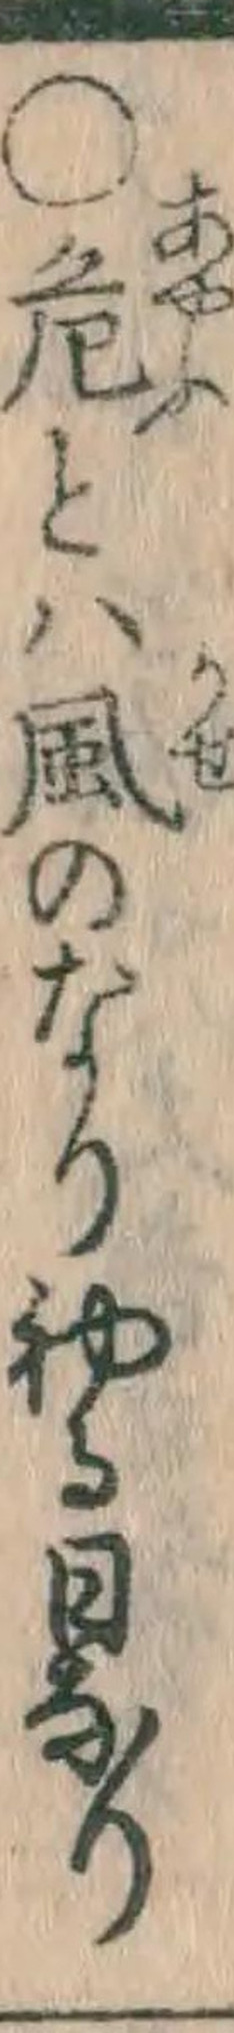○危とは風のなり初る日なり
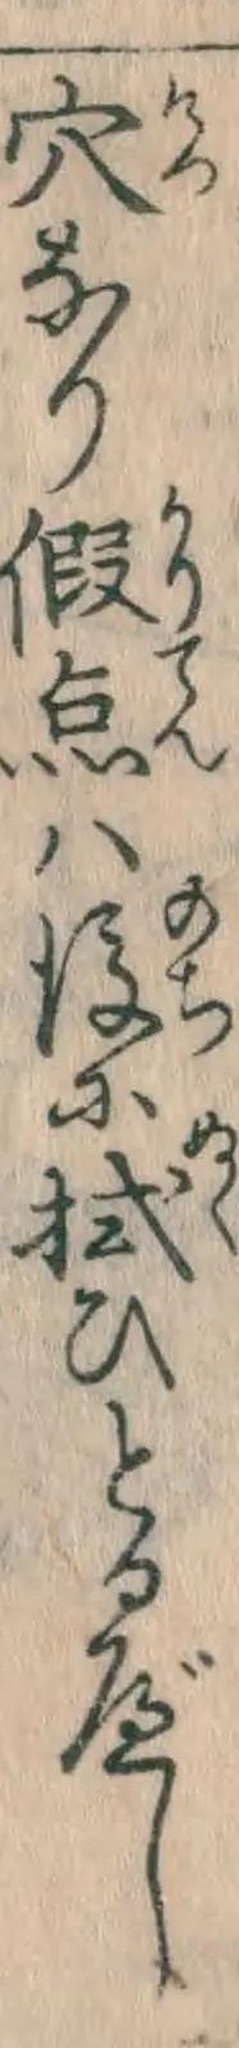穴なり仮点は後に拭ひとるべし
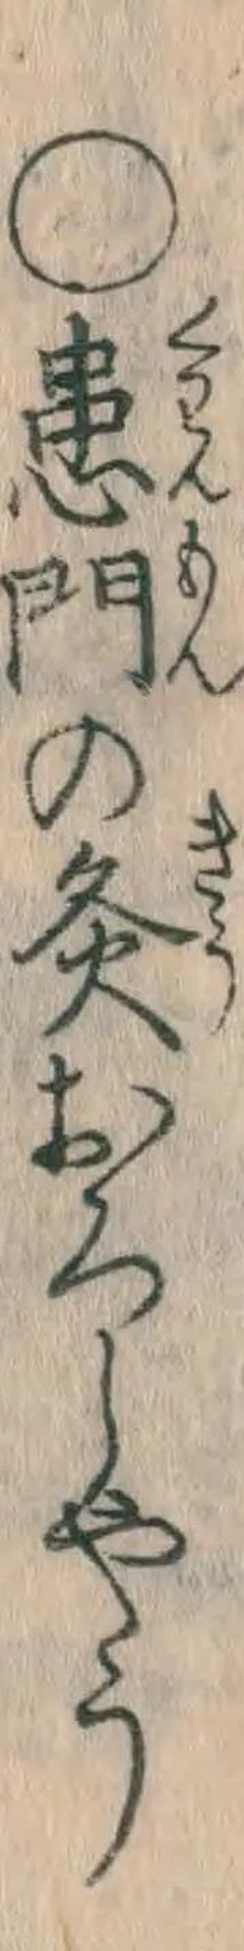○患門の灸おろしやう
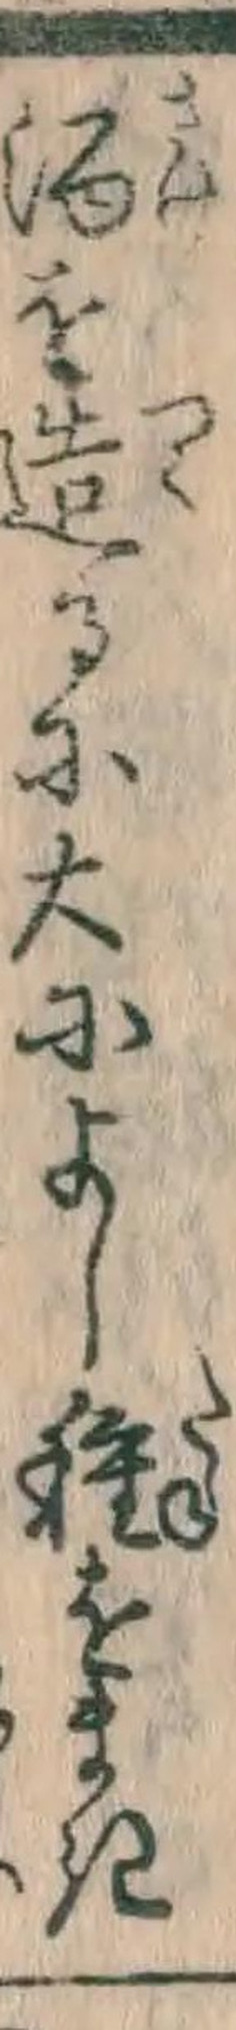酒を造るに大によし種をまき
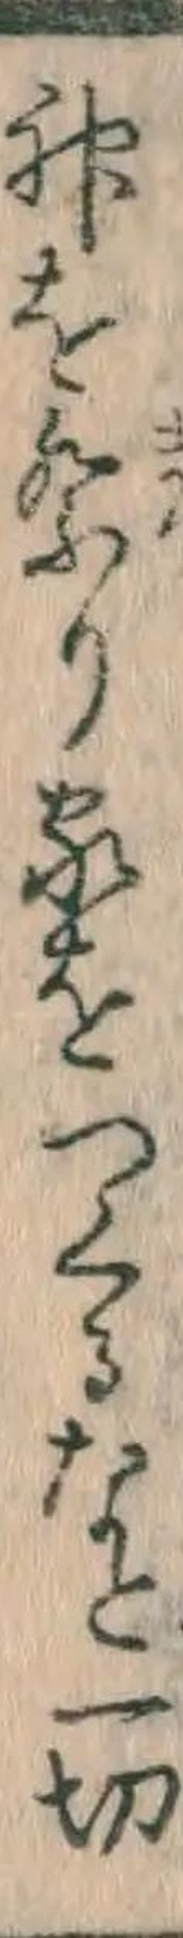神を祭り家をつくるなと一切
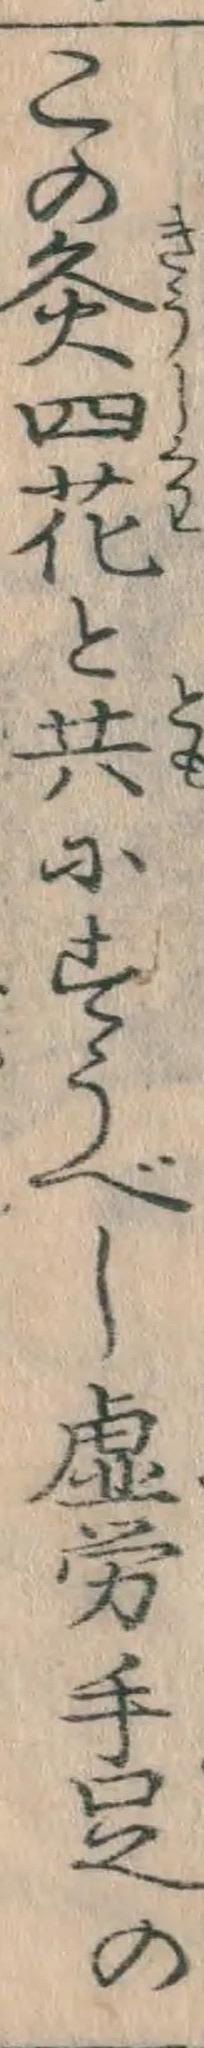この灸四花と共にすうべし虚労手足の
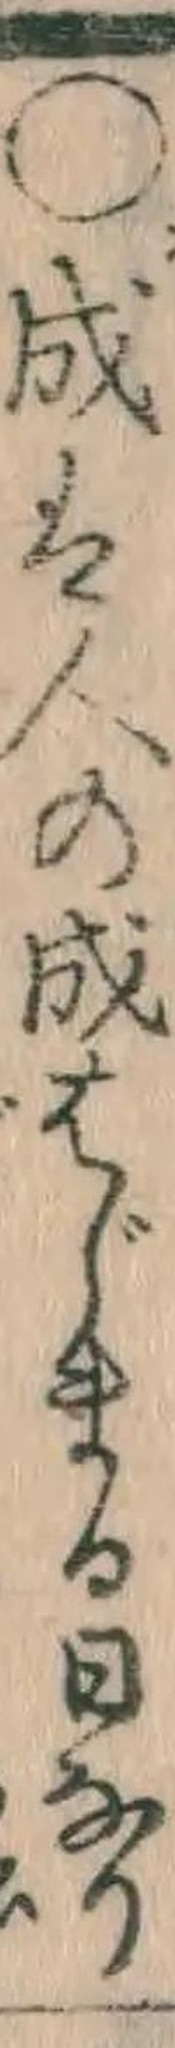○成は人の成はじまる日なり
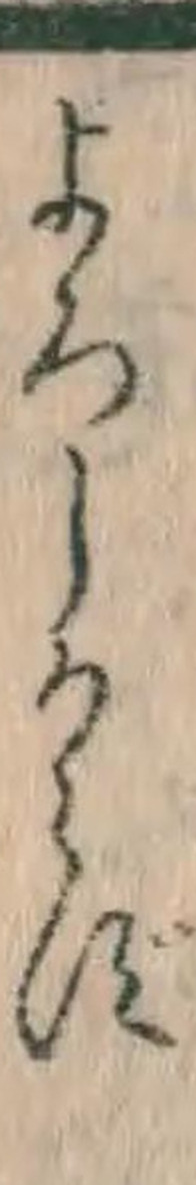よろしからず
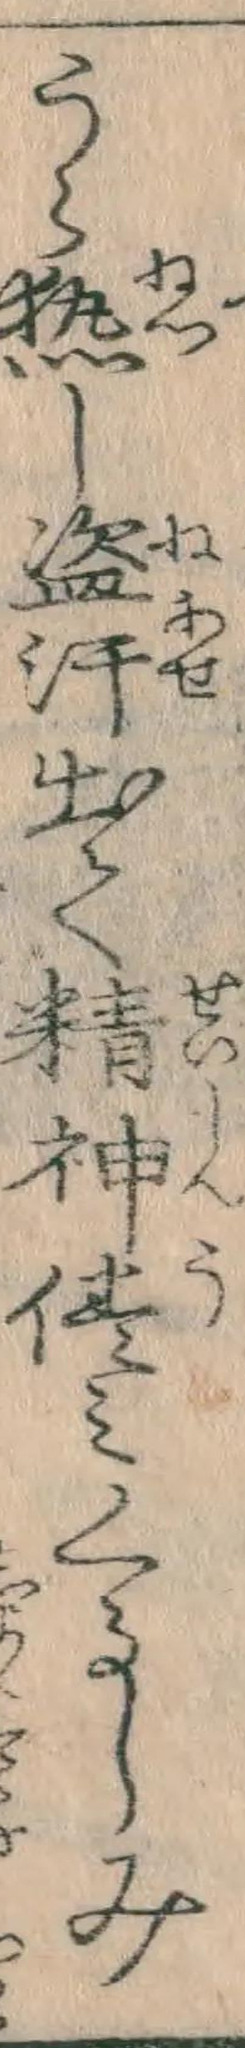うら熱し盗汗出て精神倦みくるしみ
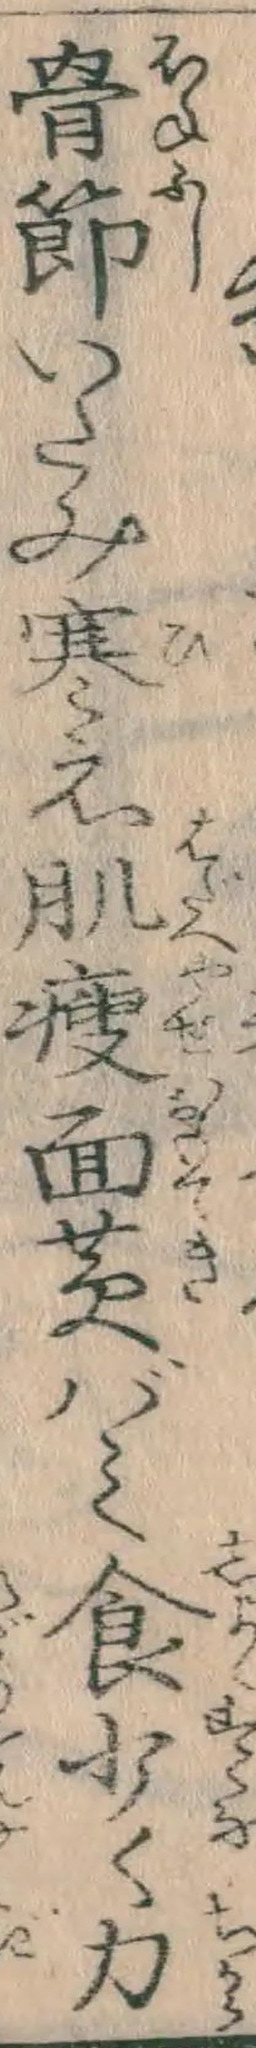骨節いたみ寒え肌痩面黄ばみ食少く力
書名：広益秘事大全 3巻. [4]
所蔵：国立国会図書館 National Diet Library, JAPAN
